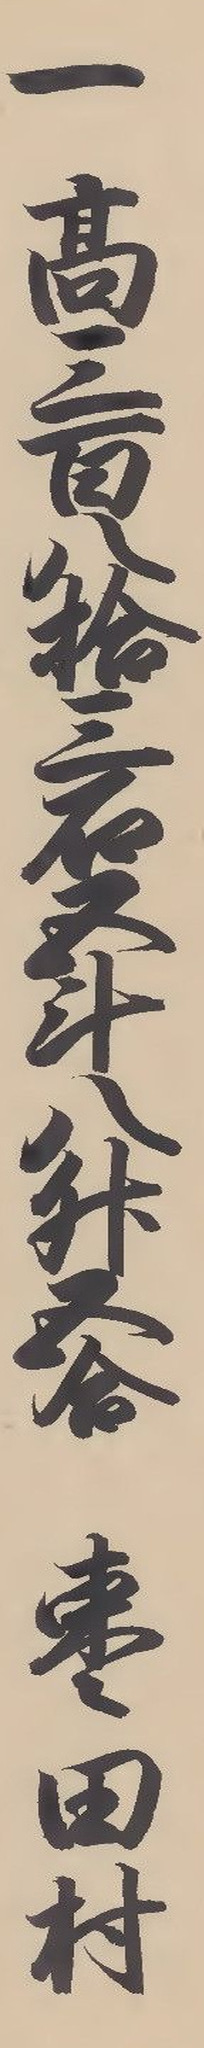一高三百八拾三石五斗八升五合棗田村
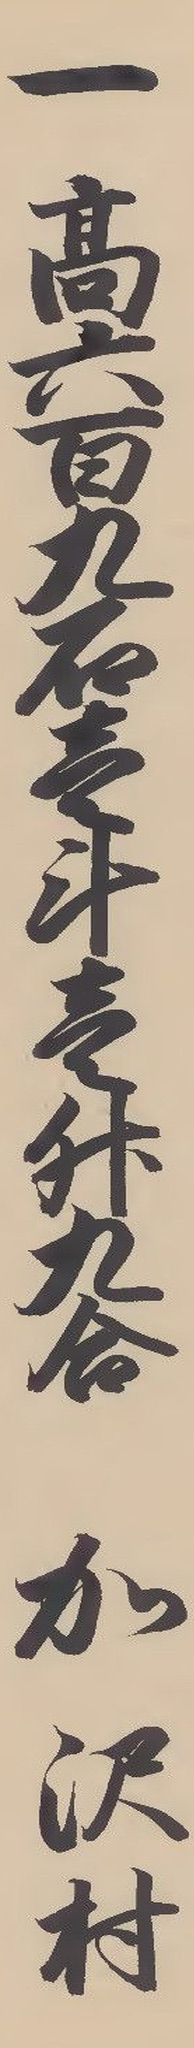一高六百九石壱斗壱升九合加沢村
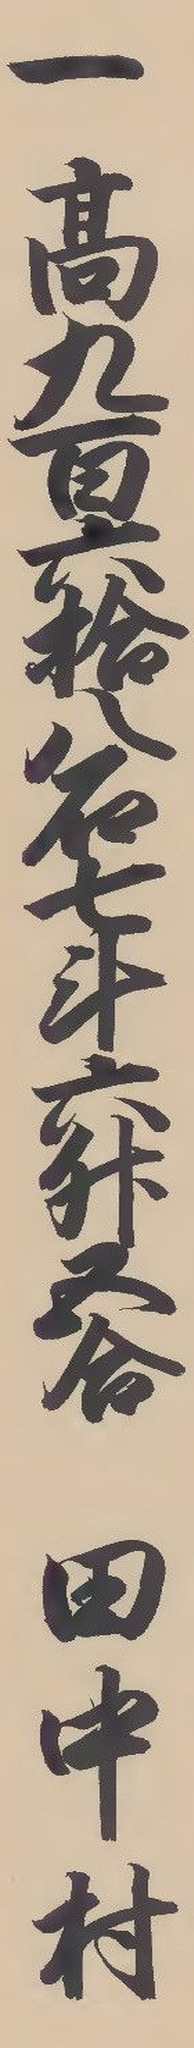一高九百六拾八名七斗六升五合田中村

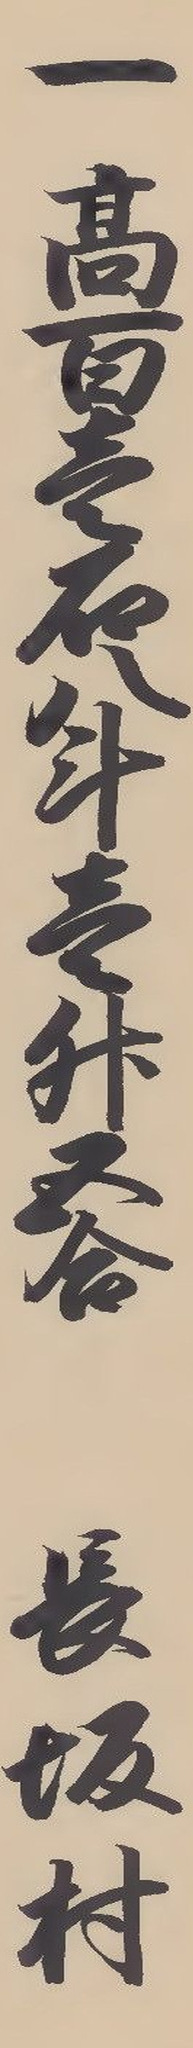一高百壱石八斗壱升五合長坂村
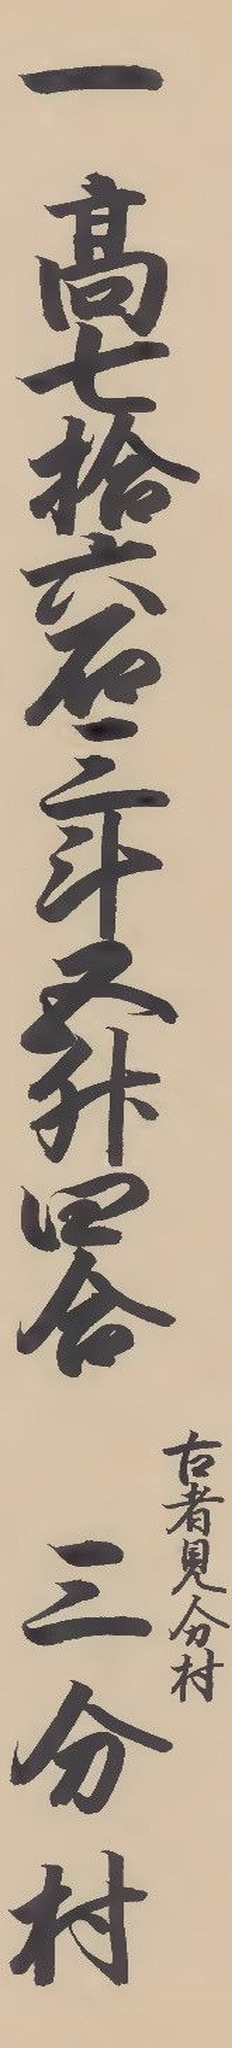一高七拾六石三斗五升四合三分村
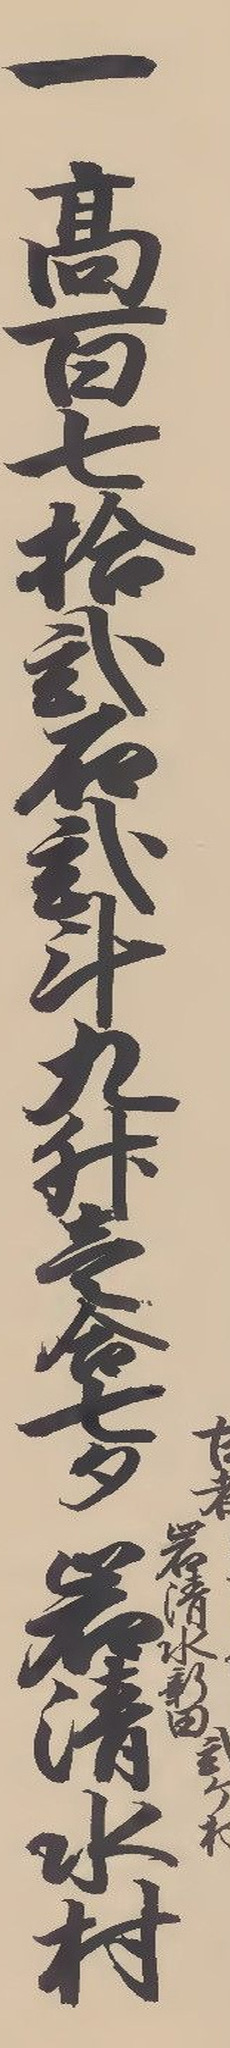一高百七拾弐石弐斗九升壱合七勺岩清水村
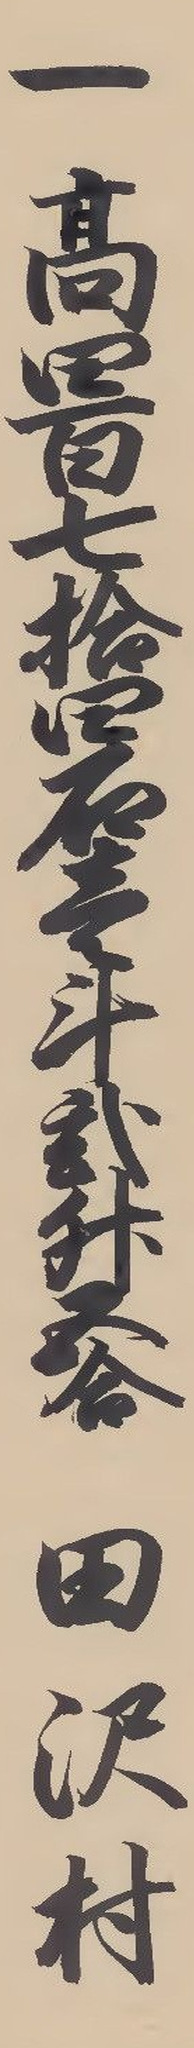一高四百七拾四石壱斗弐升五合田沢村
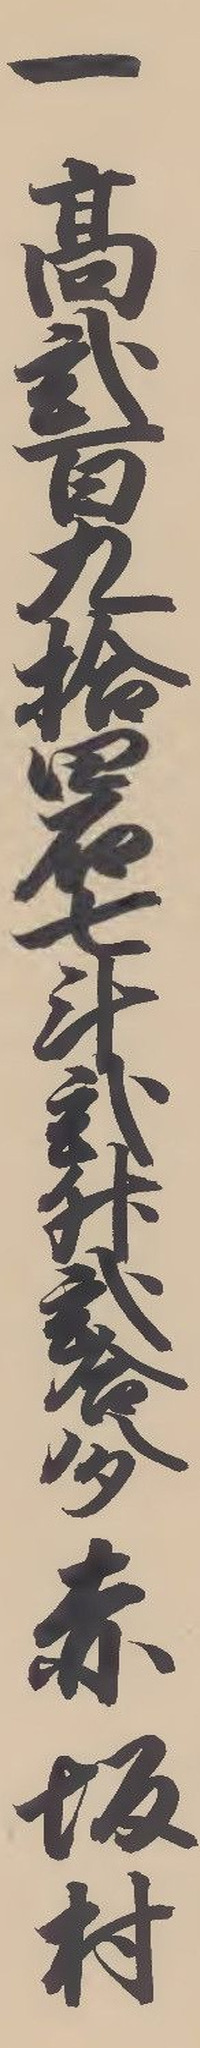一高弐百九拾四石七斗弐升弐合八勺赤坂村

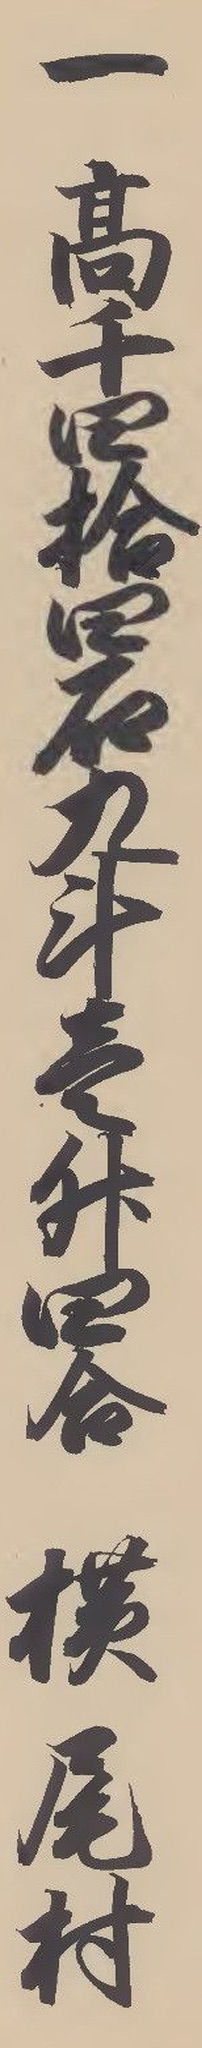一高千四拾四石九斗壱升四合横尾村
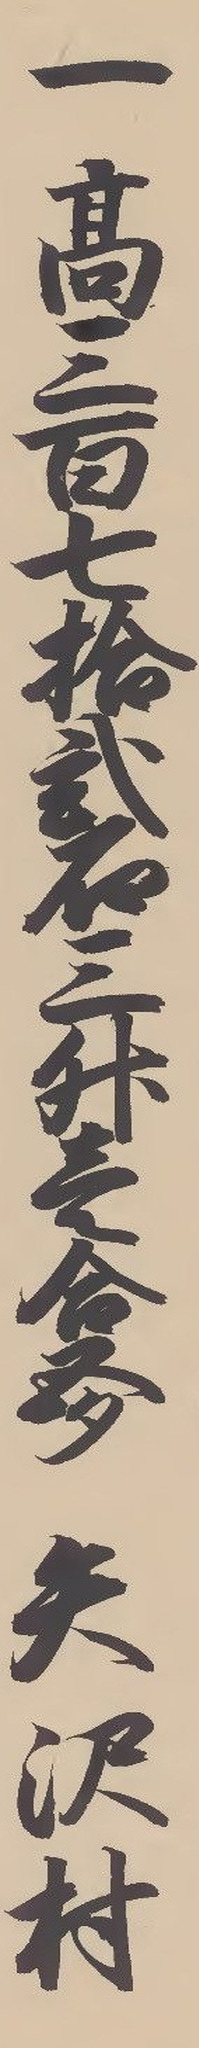一高三百七拾弐石三升壱合五勺矢沢村
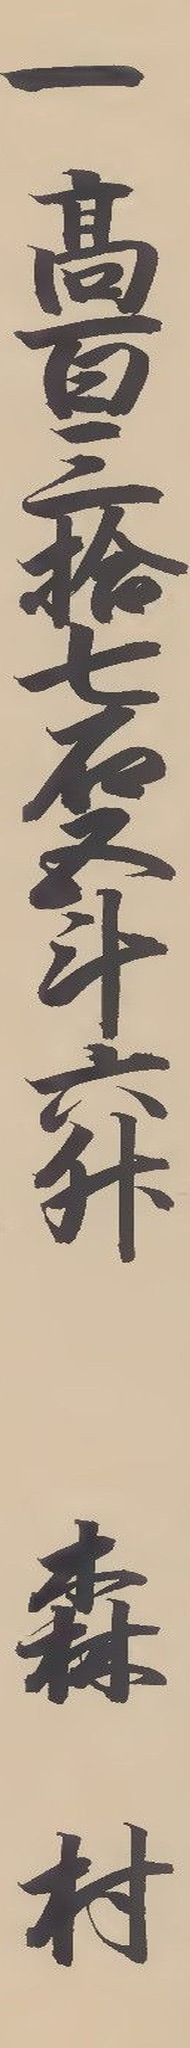一高百三拾七五斗六升森村
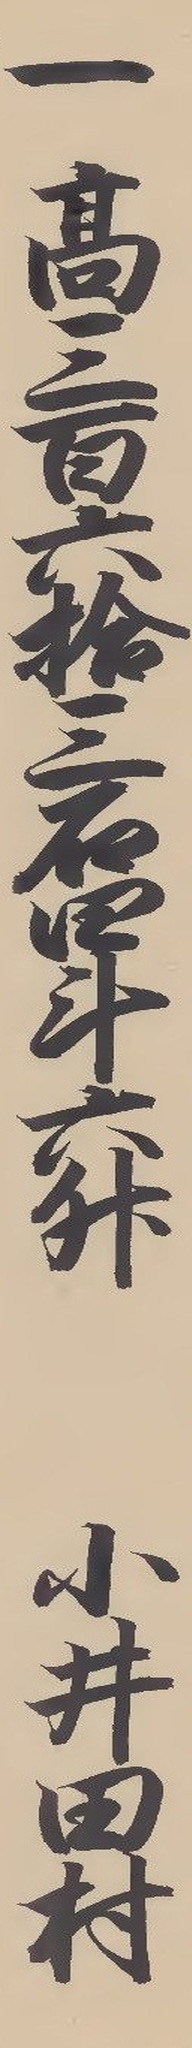一高三百六拾三石四斗六升小井田村
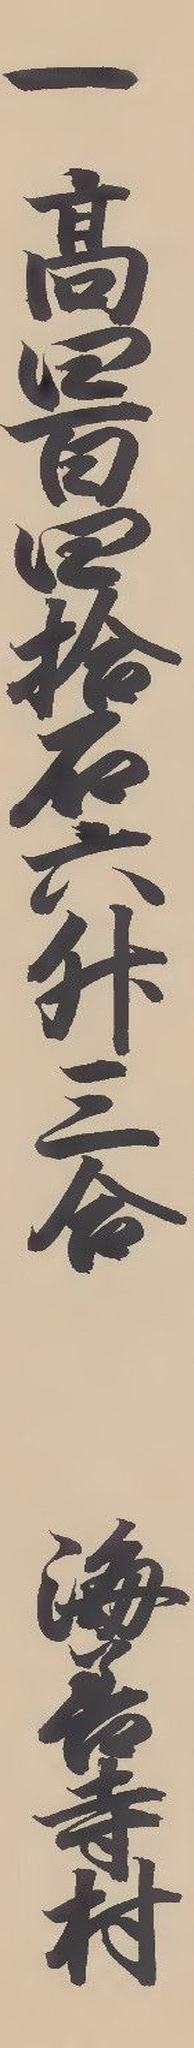一高四百四拾石六升三合海善寺村

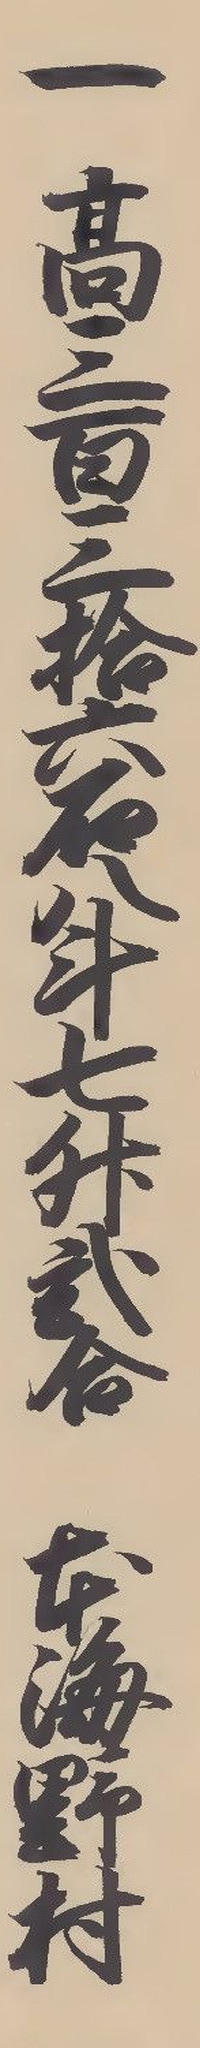一高三百三拾六石八斗七升弐合本海野村
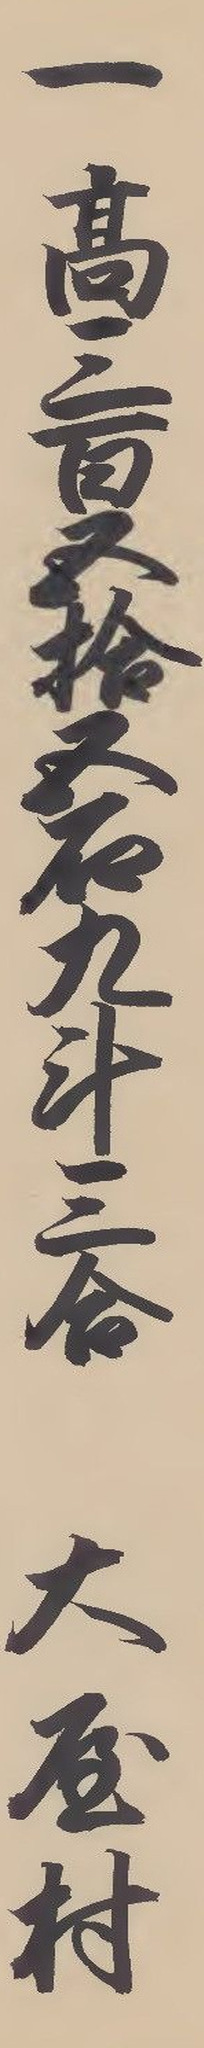一高三百五拾五石九斗三合大屋村
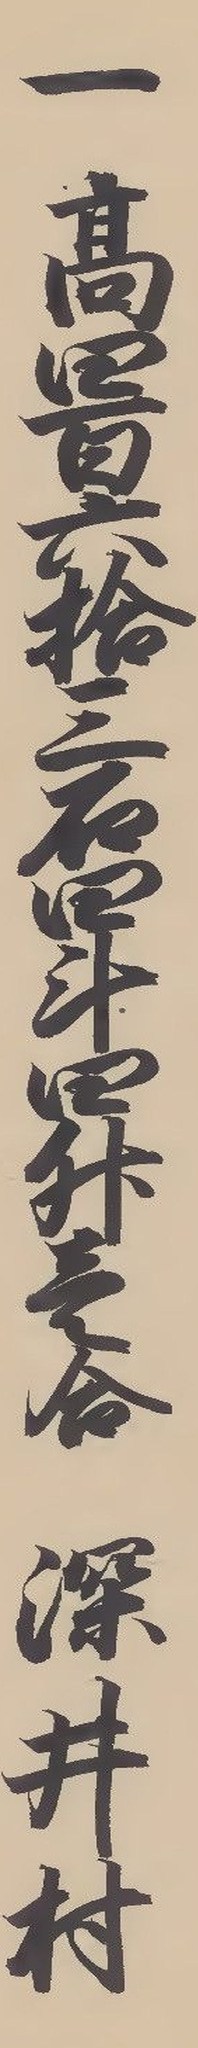一高四百六拾三石四斗四升壱合深井村
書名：信濃国郷帳
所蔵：国立公文書館 National Archives of Japan
